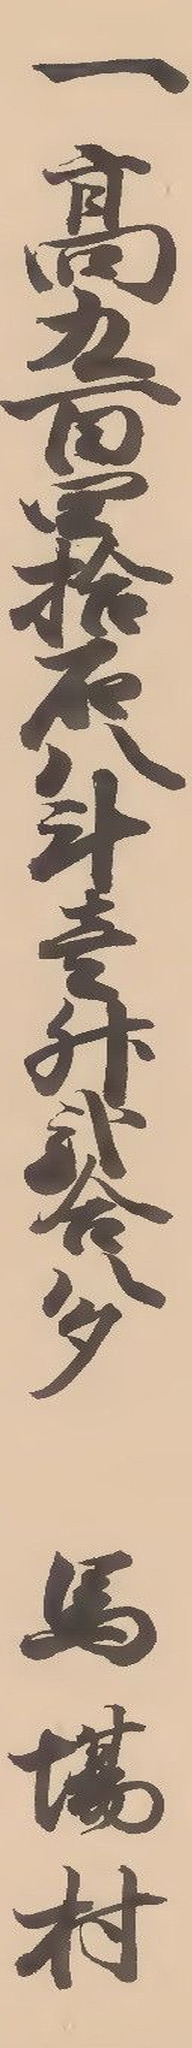一高九百四拾石八斗壱升弐合八勺馬場村
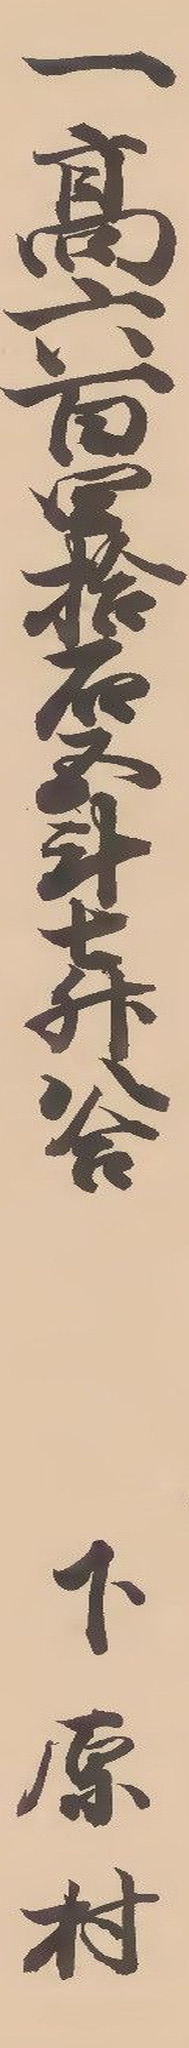一高六百四拾石五斗七升八合下原村
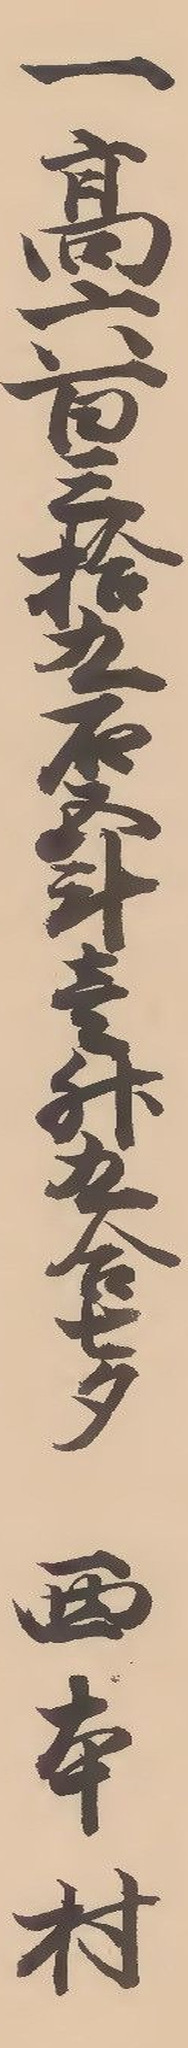一高六百三拾九石五斗壱升九合七勺西本村
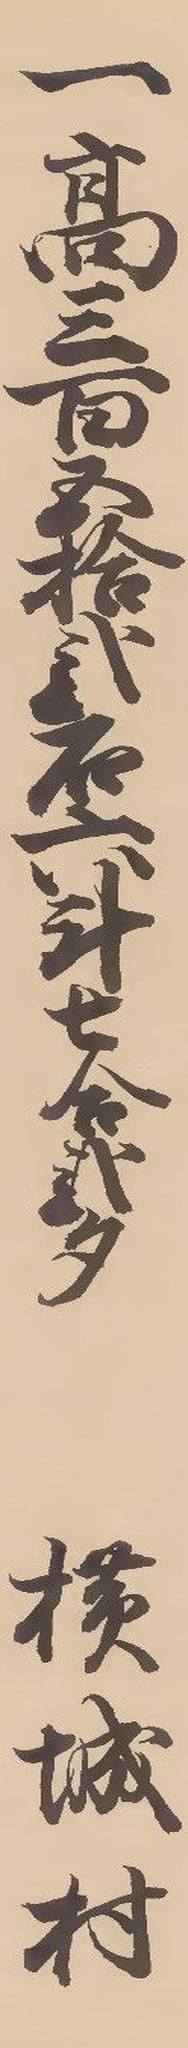一高三百五拾弐石六斗七合弐勺横城村
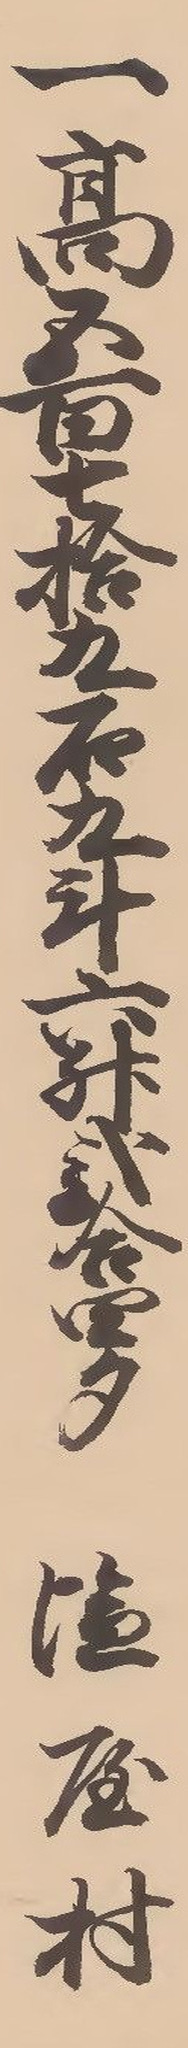一高五百七拾九石九斗六升弐合四勺塩屋村

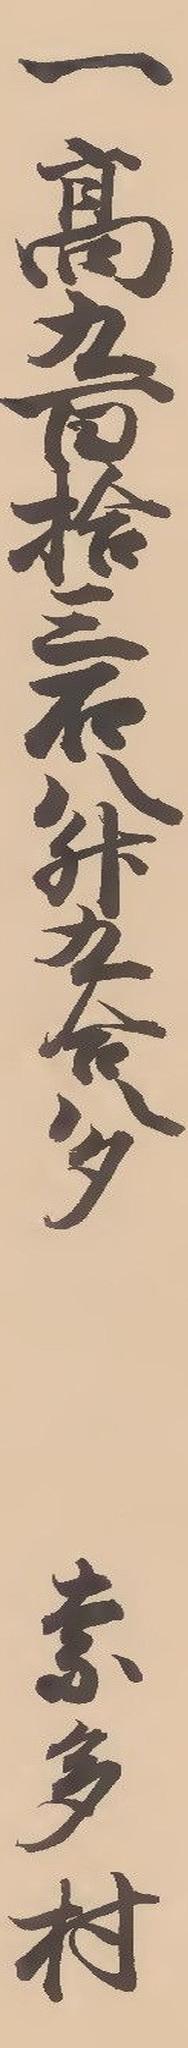一高九百拾三石八升九合八勺奈多村
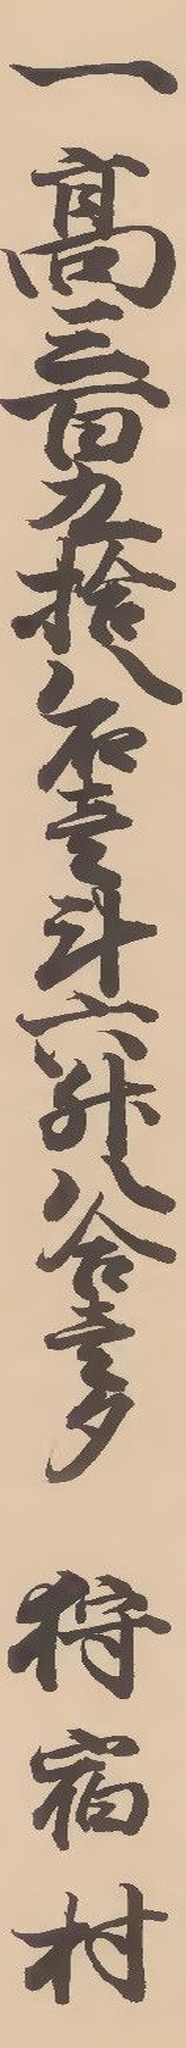一高三百九拾八石壱斗六升八合壱勺狩宿村
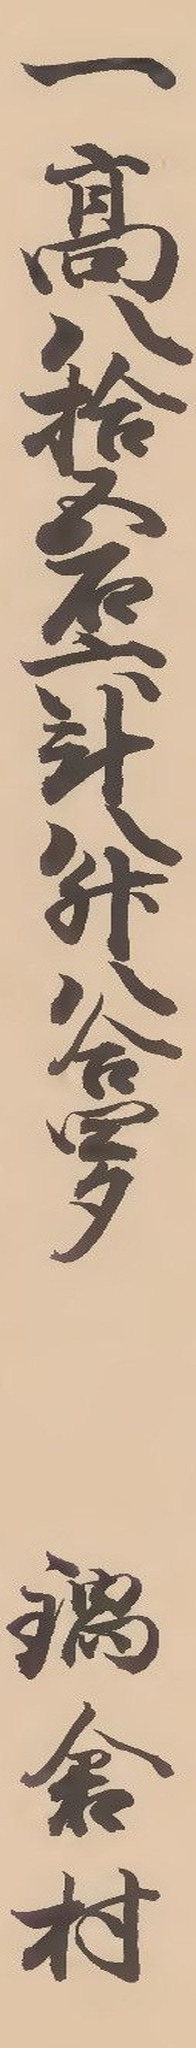一高八拾五石六斗八升八合四勺鍋倉村
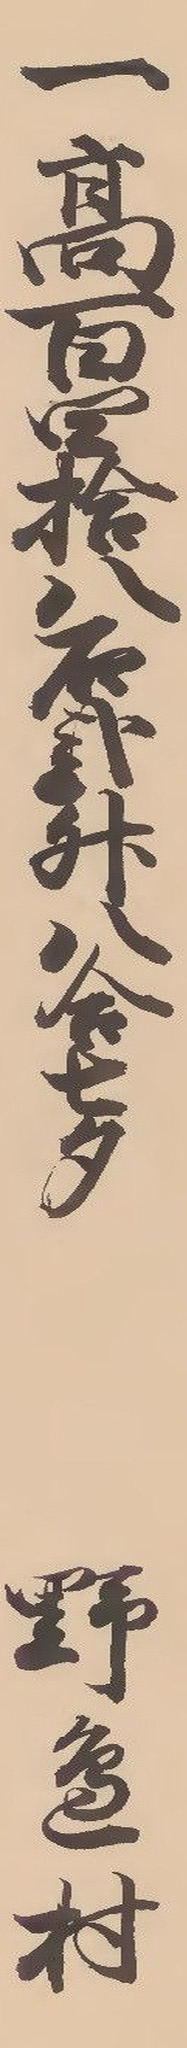一高百四拾八石弐升八合七勺野辺村
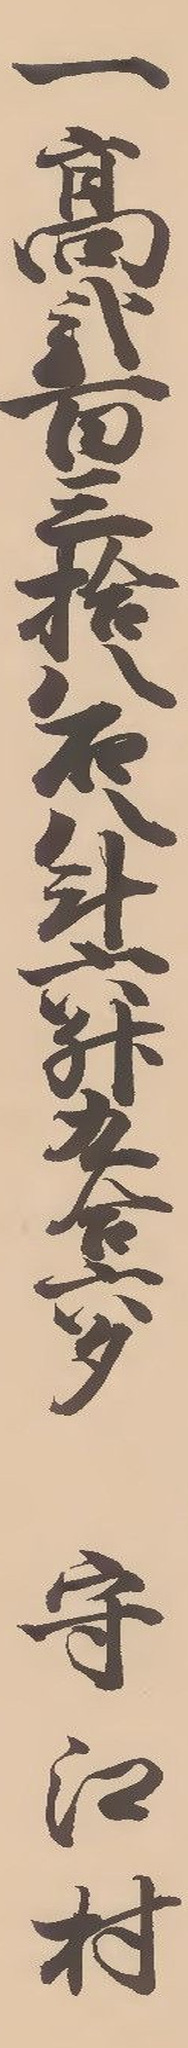一高弐百三拾八石八斗六升九合六勺守江村
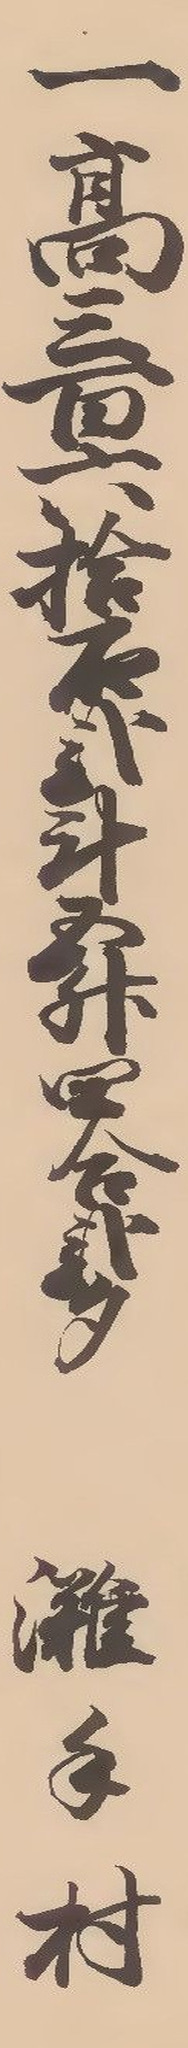一高三百六拾石弐斗五升四合弐勺灘手村
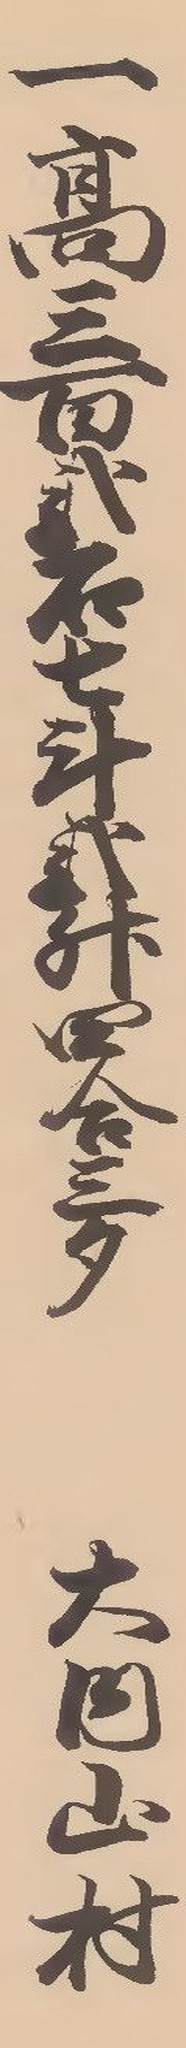一高三百弐石七斗弐升四合三勺大内山村
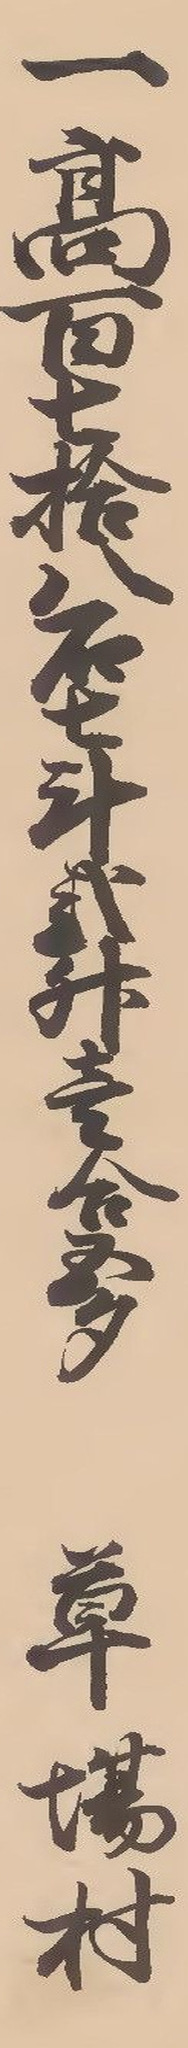一高百七拾八石七斗弐升壱合五勺草場村

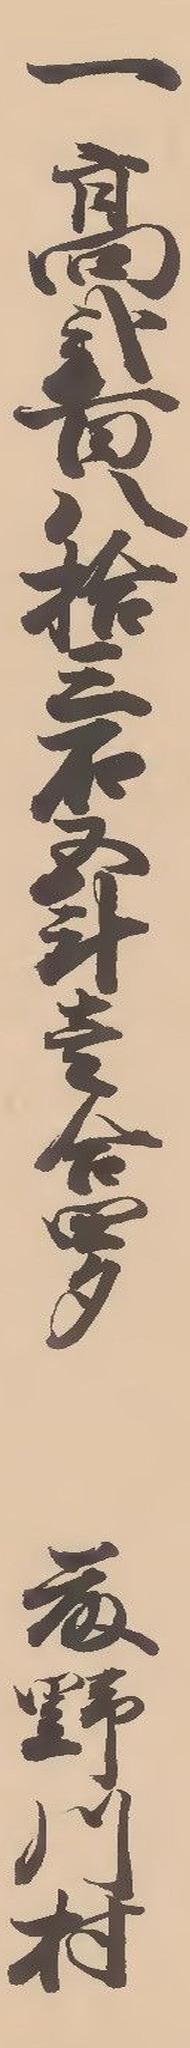一高弐百八拾三石五斗壱合四勺藤野川村
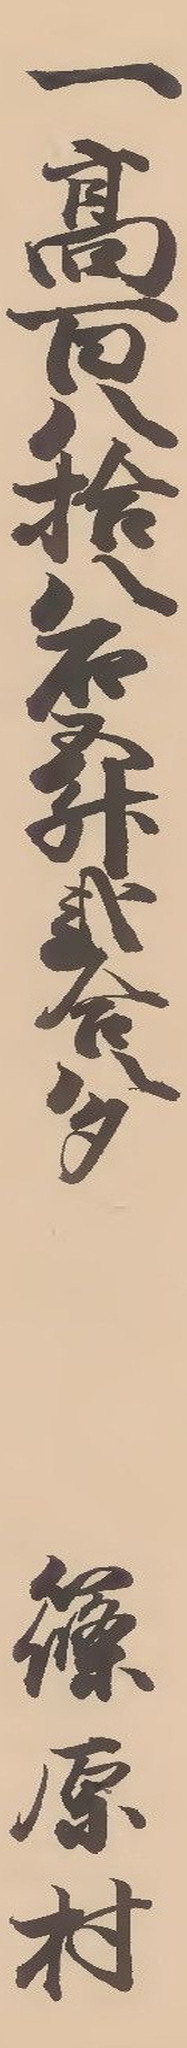一高百八拾八石五升弐合八勺篠原村
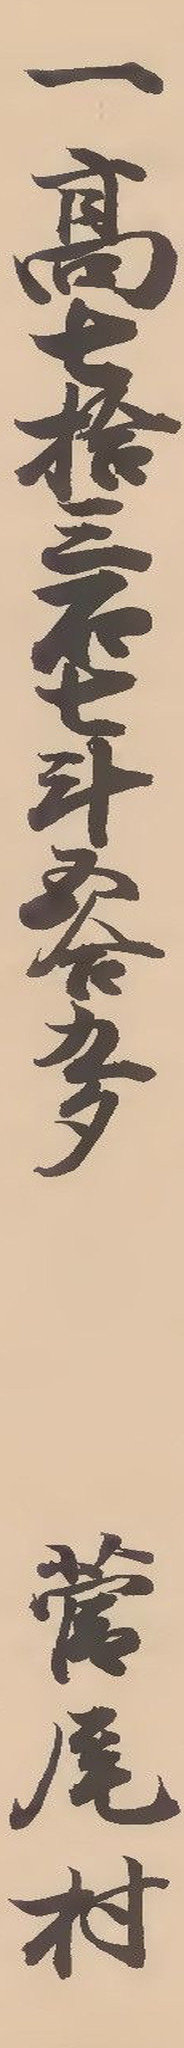一高七拾三石七斗五合九勺菅尾村
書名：豊後国郷帳
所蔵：国立公文書館 National Archives of Japan
